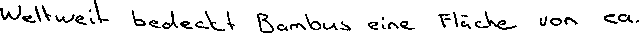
Weltweit bedeckt Bambus eine Fläche von ca.
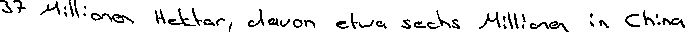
37 Millionen Hektar, davon etwa sechs Millionen in China
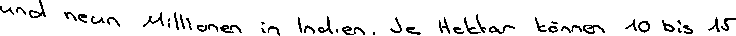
Und neun Millionen in Indien. Je Hektar können 10 bis 15
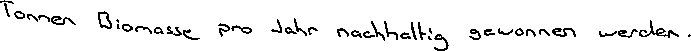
Tonnen Biomasse pro Jahr nachhaltig gewonnen werden.
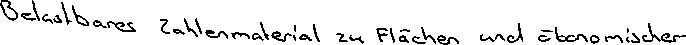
Belastbares Zahlenmaterial zu Flächen und ökonomischer
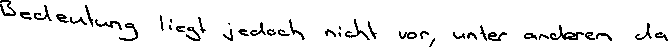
Bedeutung liegt jedoch nicht vor, unter anderem da
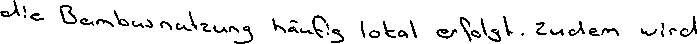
die Bambusnutzung häufig lokal erfolgt. Zudem wird
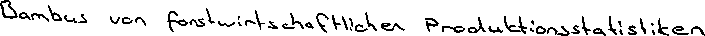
Bambus von forstwirtschaftlichen Produktionsstatistiken
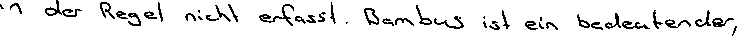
In der Regel nicht erfasst. Bambus ist ein bedeutender,
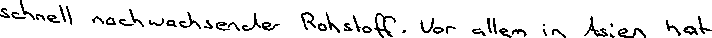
schnell nachwachsender Rohstoff. Vor allem in Asien hat
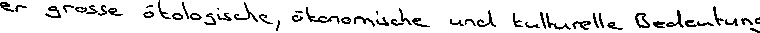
Er große ökologische, ökonomische und kulturelle Bedeutung;
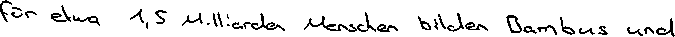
für etwa 1,5 Milliarden Menschen bilden Bambus und
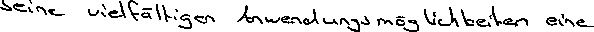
seine vielfältigen Anwendungsmöglichkeiten eine
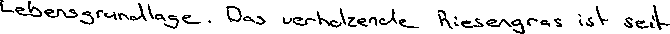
Lebensgrundlage. Das verholzende Riesengras ist seit
